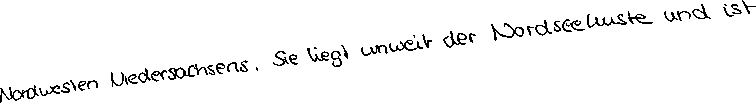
Nordwesten Niedersachsens. Sie liegt unweit der Nordseeküste und ist
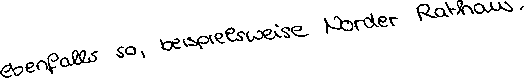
ebenfalls so, beispielsweise Norder Rathaus.
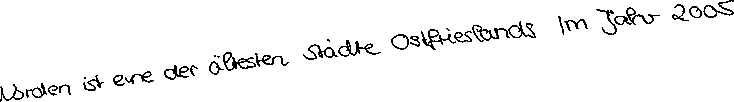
Norden ist eine der ältesten Städte Ostfrieslands. Im Jahr 2005
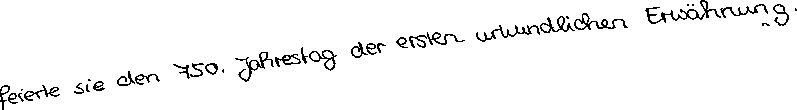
feierte sie den 750. Jahrestag der ersten urkundlichen Erwähnung.
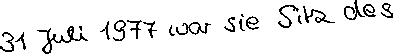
31. Juli 1977 war sie Sitz des
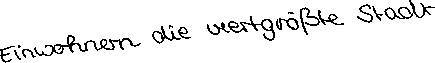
Einwohnern die viertgrößte Stadt
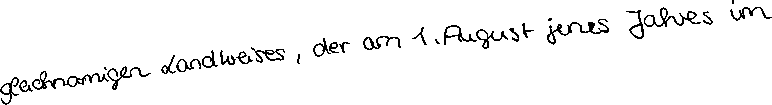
gleichnamigen Landkreises, der am 1. August jenes Jahres im
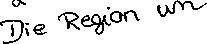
Die Region um
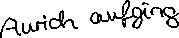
Aurich aufging.
